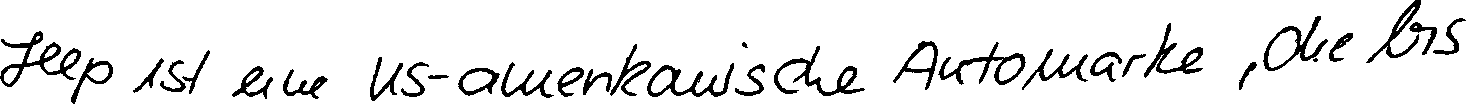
Jeep ist eine US-amerikanische Automarke, die bis
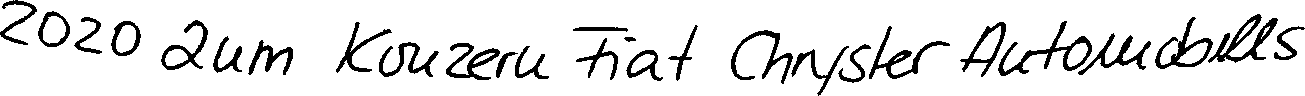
2020 zum Konzern Fiat Chrysler Automobiles
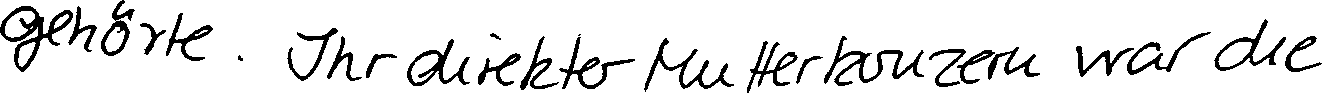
gehörte. Ihr direkter Mutterkonzern war die
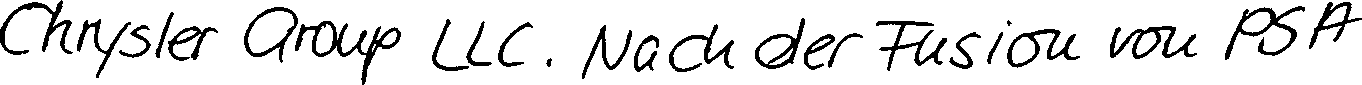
Chrysler Group LLC. Nach der Fusion von PSA
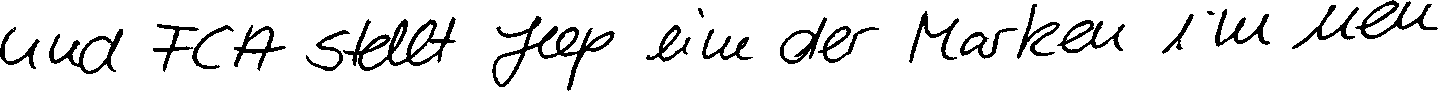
und FCA stellt Jeep eine der Marken im neu
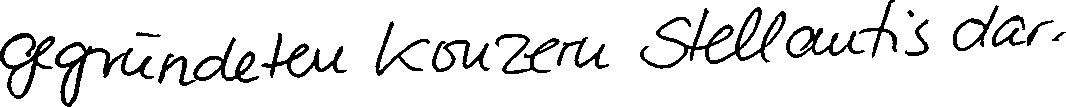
gegründeten Konzern Stellantis dar.
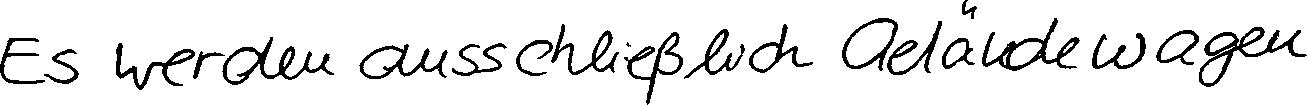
Es werden ausschließlich Geländewagen
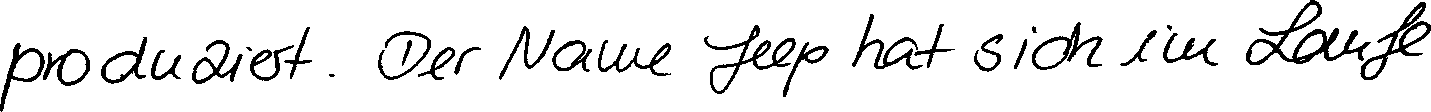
produziert. Der Name Jeep hat sich im Lauf
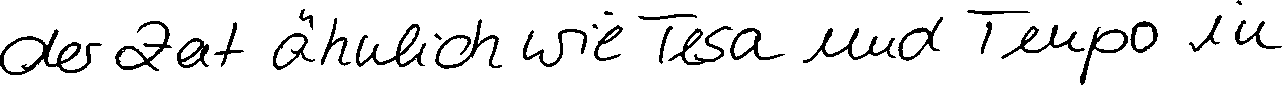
der Zeit ähnlich wie Tesa und Tempo in
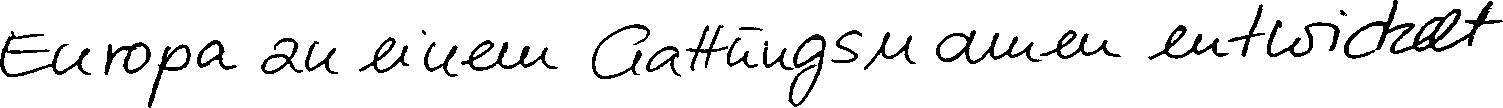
Europa zu einem Gattungsnamen entwickelt
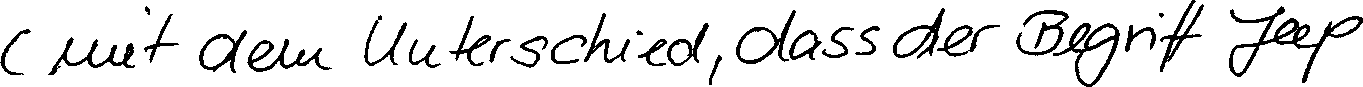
(mit dem Unterschied allerdings, dass der Begriff Jeep
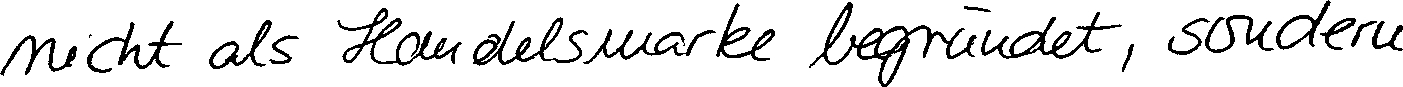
nicht als Handelsmarke begründet, sondern
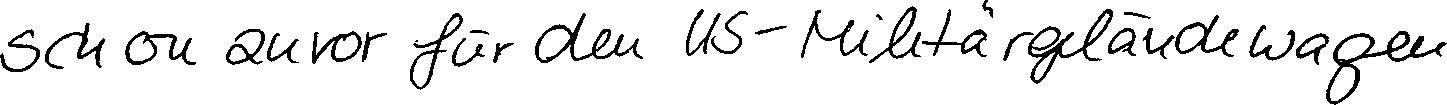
schon zuvor für den US-Militärgeländewagen
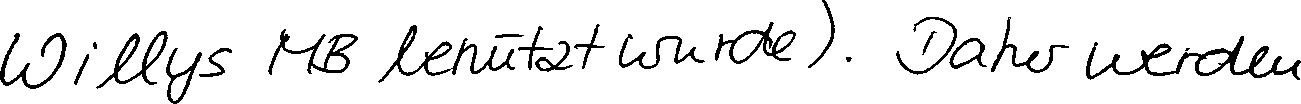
Willys MB benutzt wurde). Daher werden
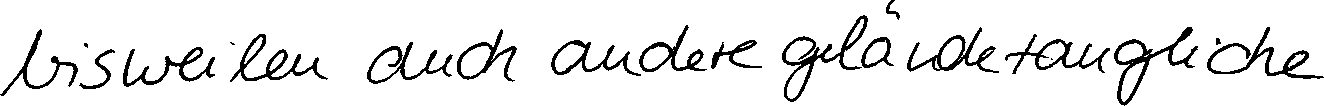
bisweilen auch andere geländetaugliche
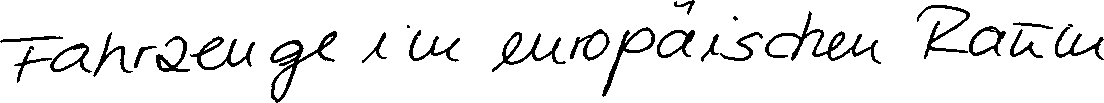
Fahrzeuge im europäischen Raum
